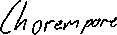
Chorempore
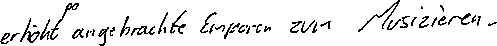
erhöht angebrachte Emporen zum Musizieren.
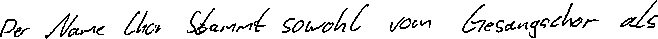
Der Name Chor stammt sowohl vom Gesangschor als
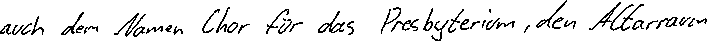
auch dem Namen Chor für das Presbyterium, den Altarraum
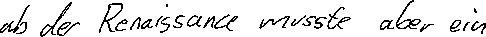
ab der Renaissance musste aber ein
